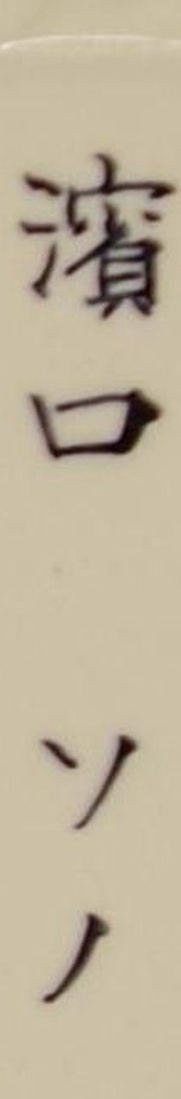濱口ソノ
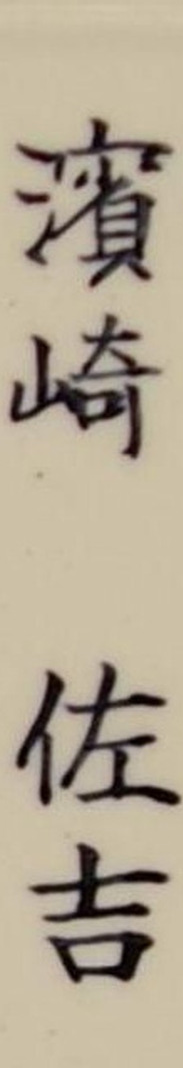濱崎佐吉
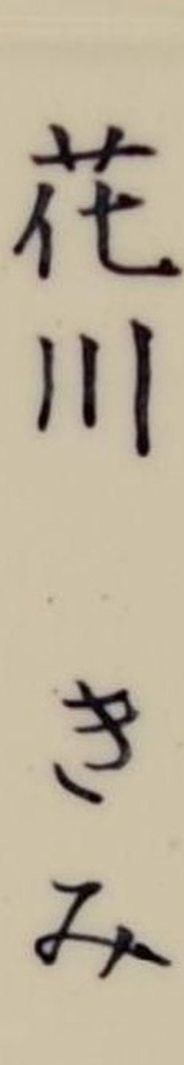花川きみ
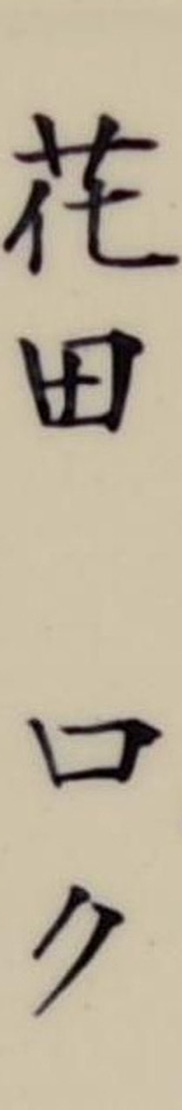花田ロク
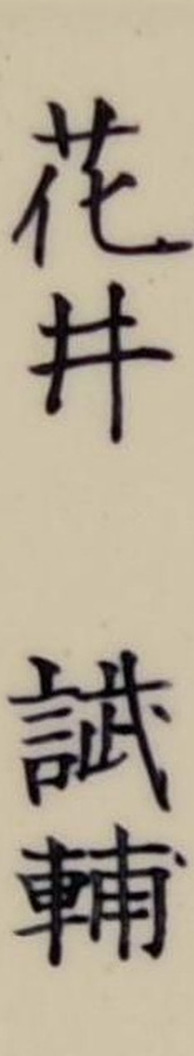花井誠輔
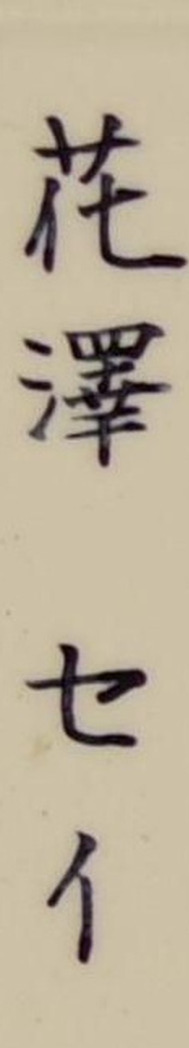花澤セイ
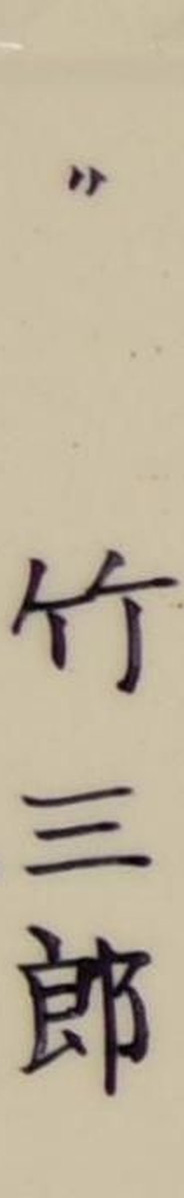竹三郎
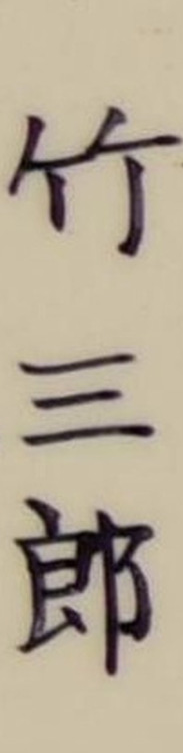竹三郎
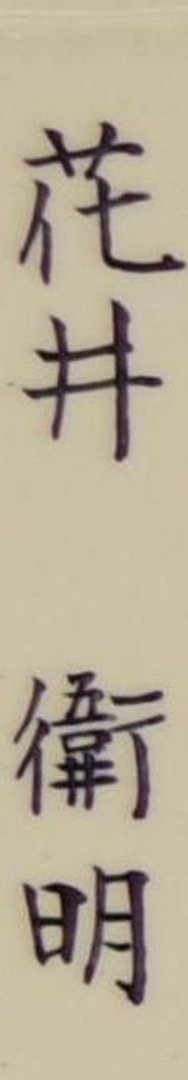花井衛明

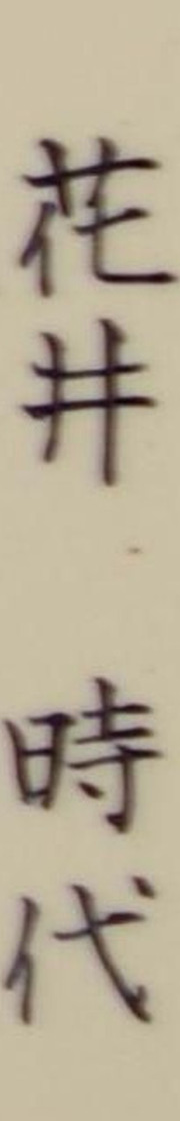花井時代
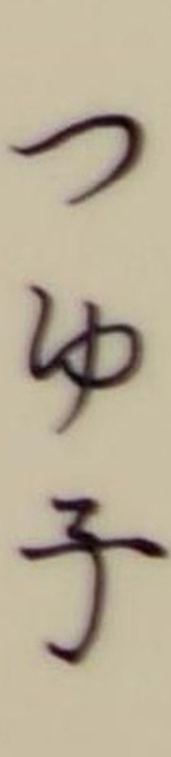つゆ子
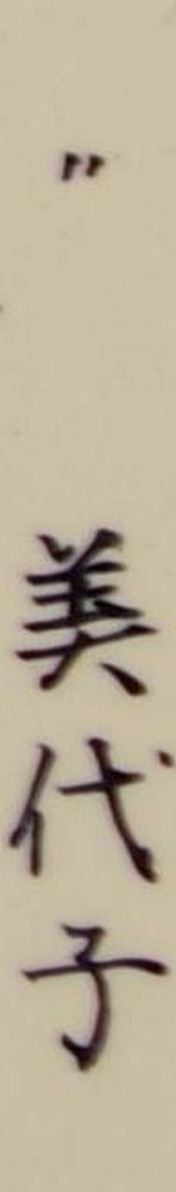美代子
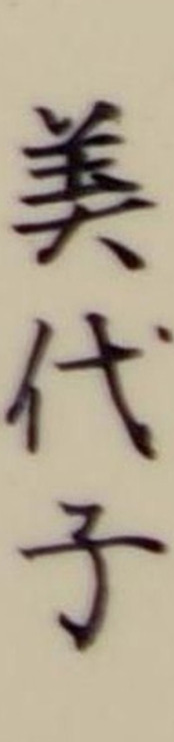美代子
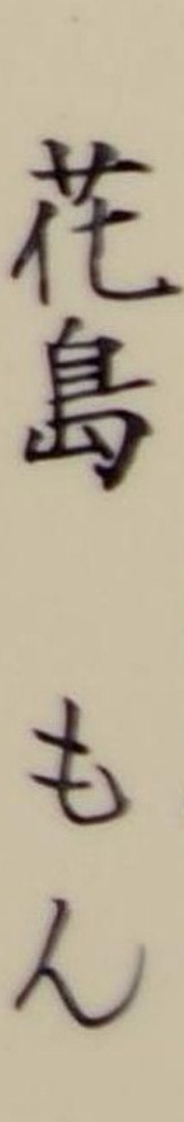花島もん
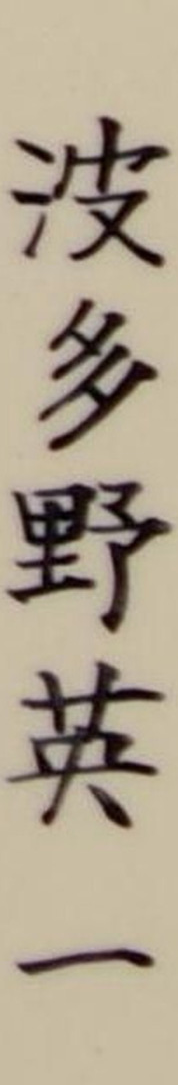波多野英一
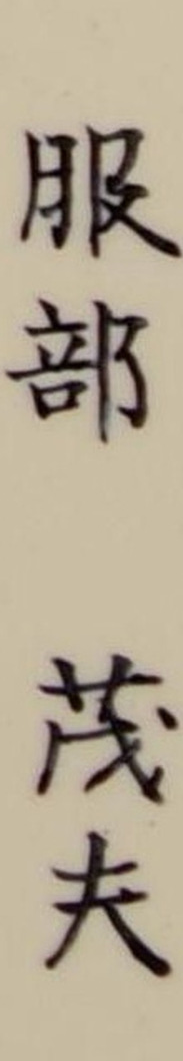服部茂夫
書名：A~D
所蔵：koyasan kongobuji
